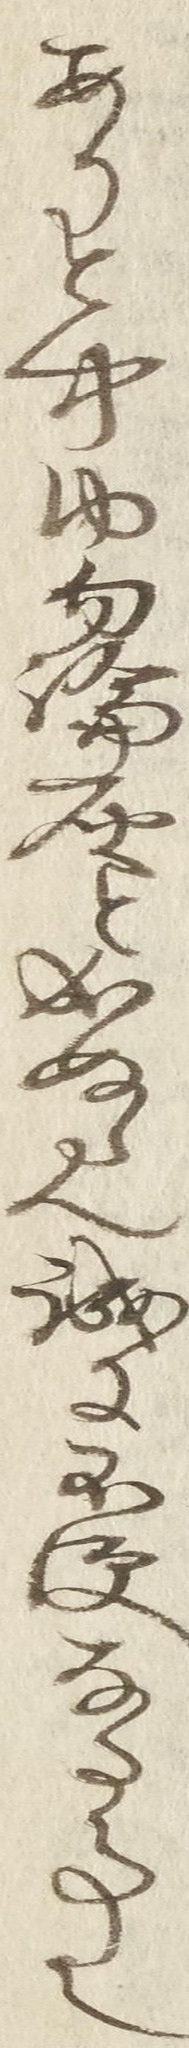ありと聞ゆ勿論灰と成ぬる也誠に不便なる事也
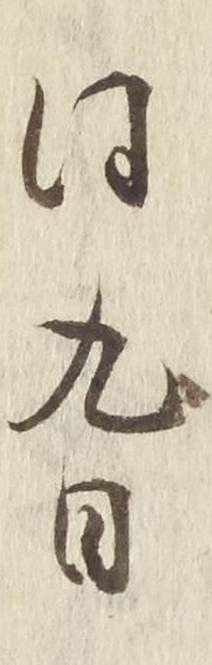同九日
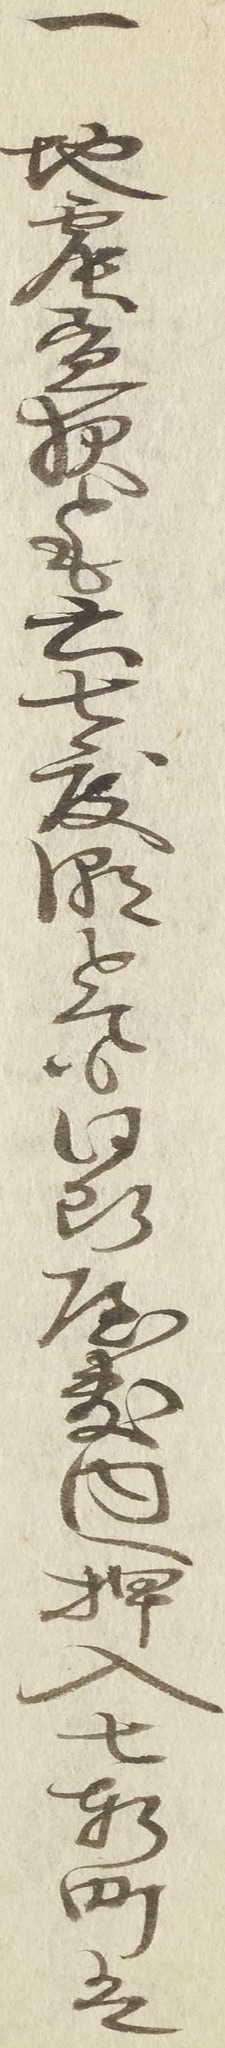一地震昼夜とも六七度潮とても同断屋敷内へ押入七軒町は
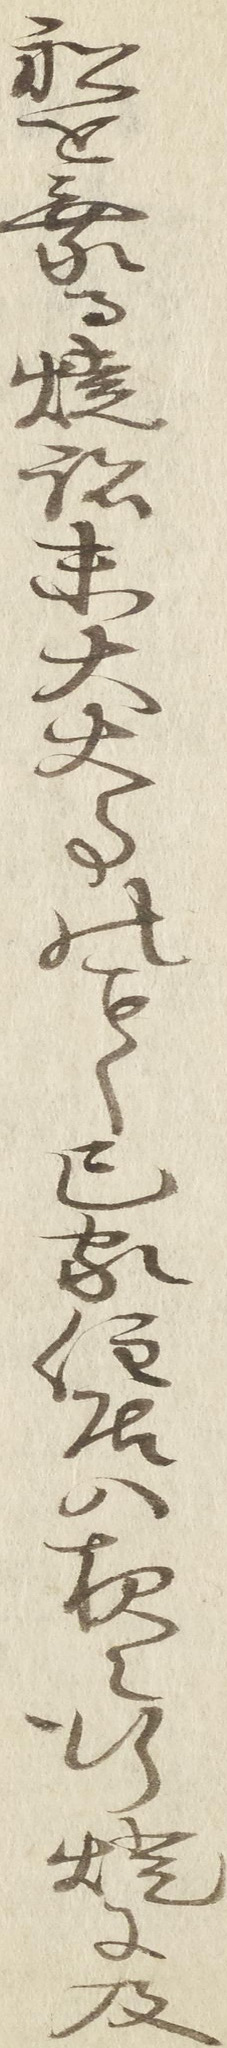船を乗る焼跡未大火事のことく己家住居は夜に行燈に及
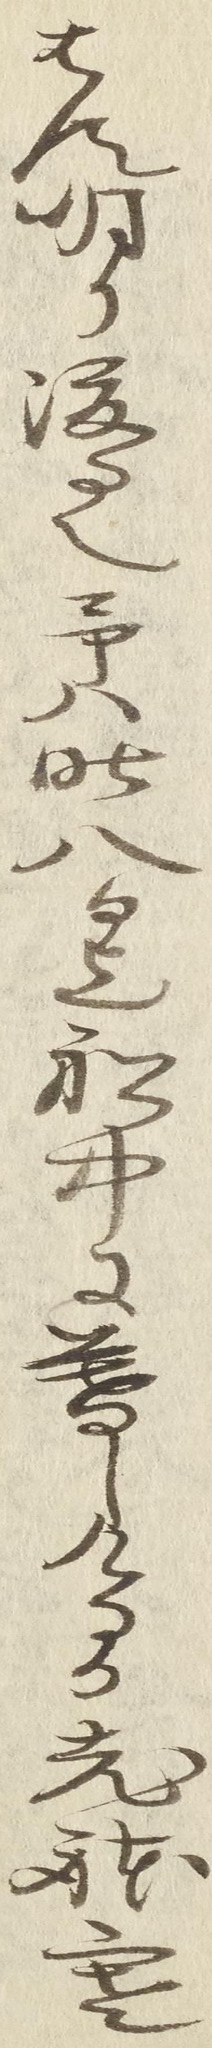はす明り渡る也予は昨八日迄船中に暮しけるか老体寒
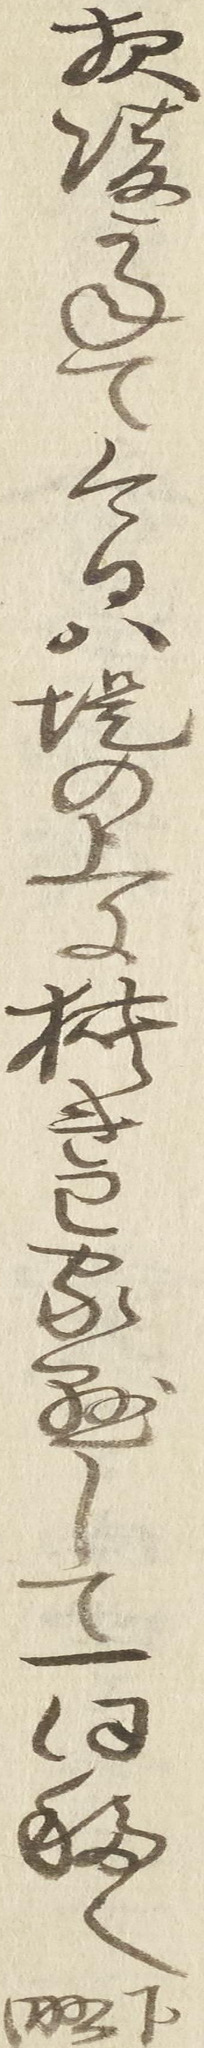夜凌かねて今日は堤の上に狭き己家懸して一同移也下略
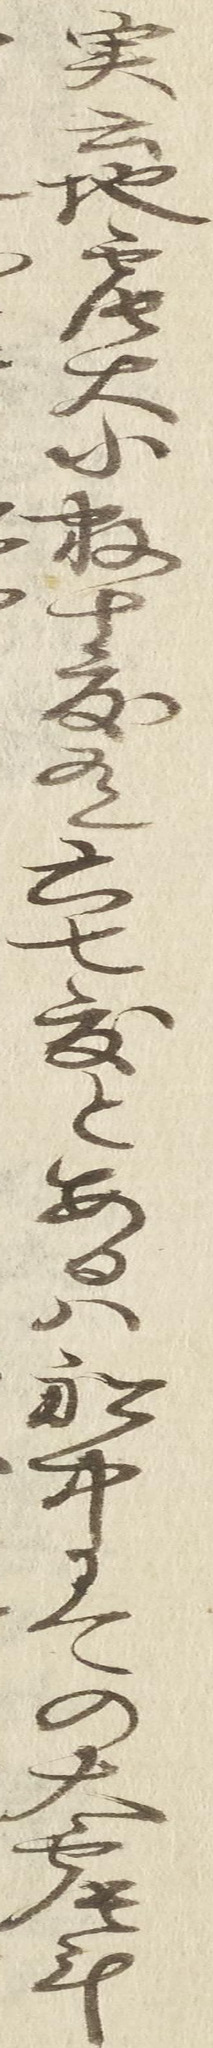実云地震大小数十度有六七度とあるは船中にての大震斗
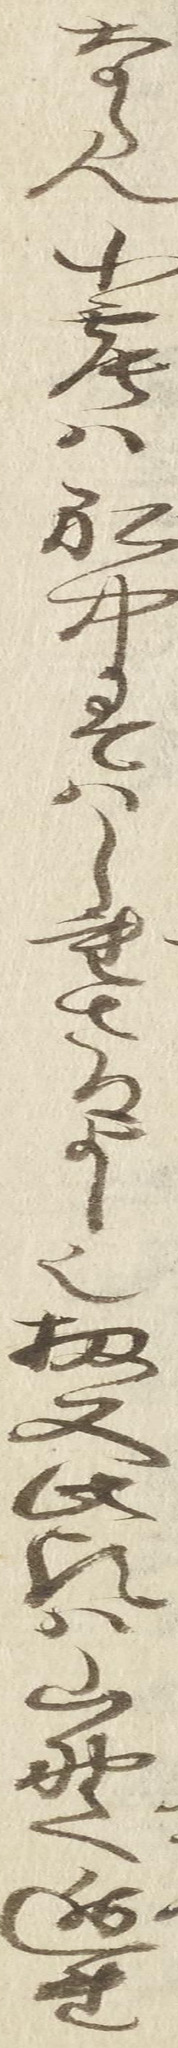ならん小震は船中にてはしれさるよし也扨又此頃は山野へ逃れ
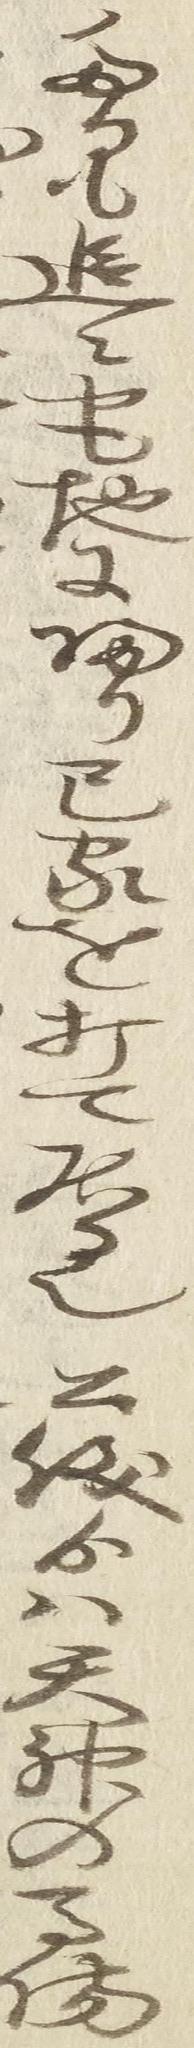たるも追々宅地に帰り己家を打て居る也公儀よりは天神の馬場
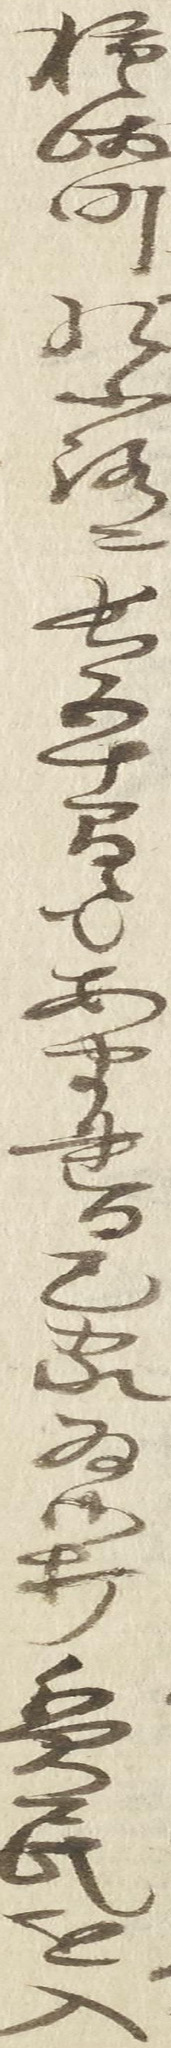種崎町弘小路に長さ五十間にもあまれる己家為御打貧民を入
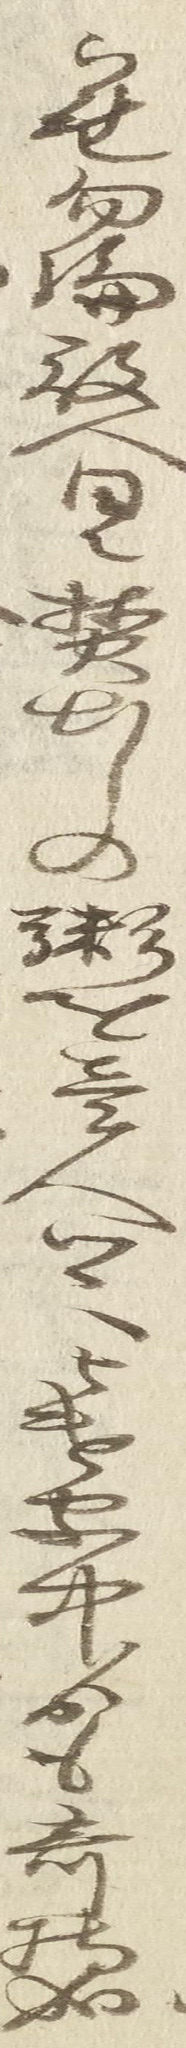らせ勿論役人日々焚出しの粥を壱人ツゝへ被遣家中よりも奇特成
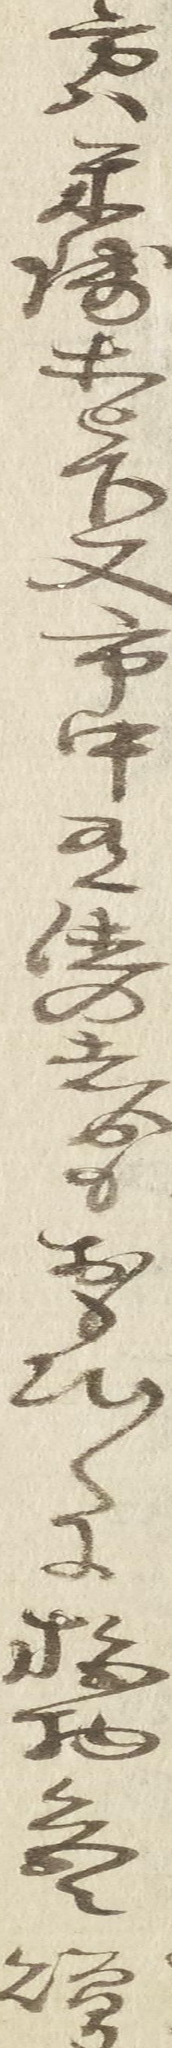方は米銭等を下又市中有徳の者よりもおもひ〳〵に施物色々贈り
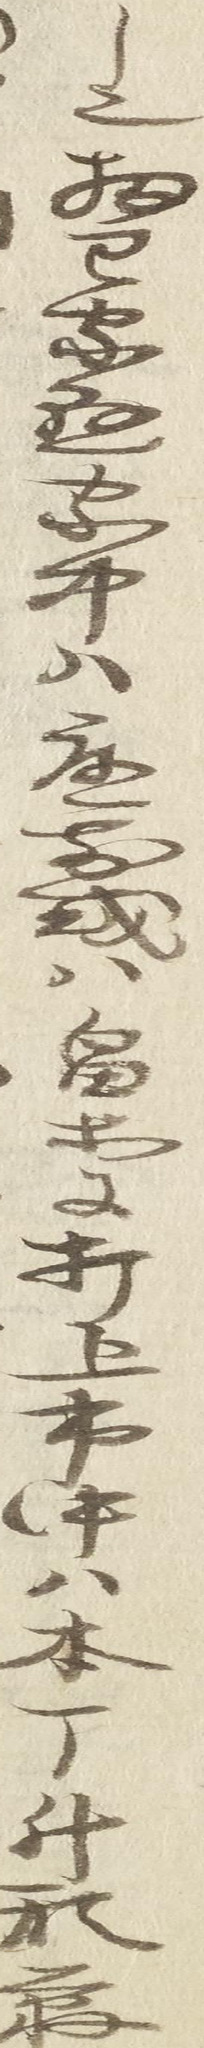し也扨己家懸家中は庭前或は畠等に打上市中は本丁升形勤
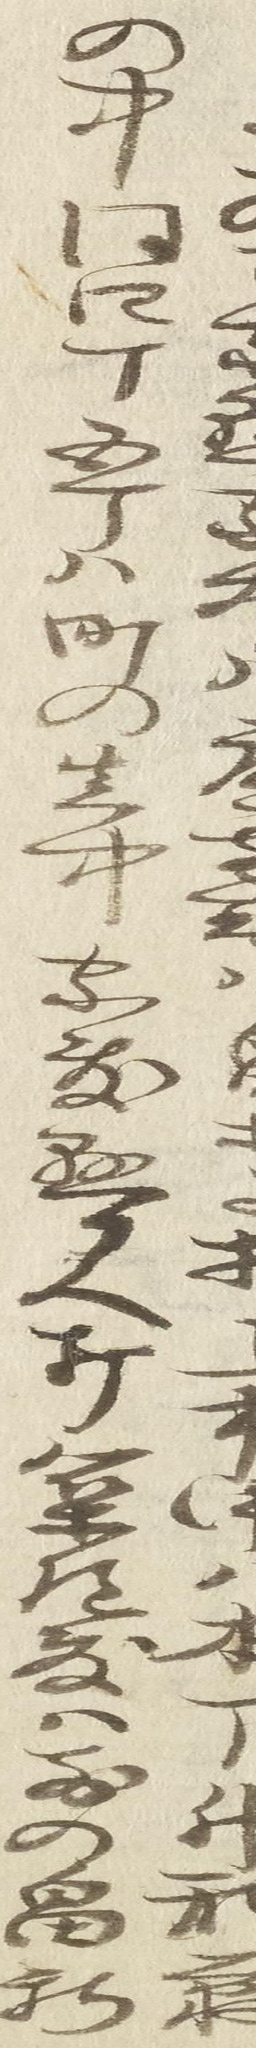の中同四丁五丁は町の真中家敷懸りへ打築屋敷は前の畠新
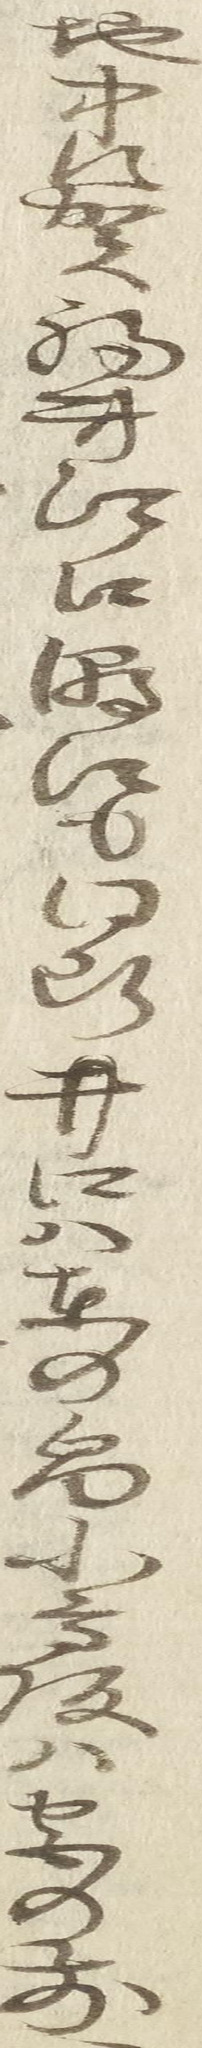地中須賀福井江口潮口も同断井口は東の畠小高阪は宮の前へ
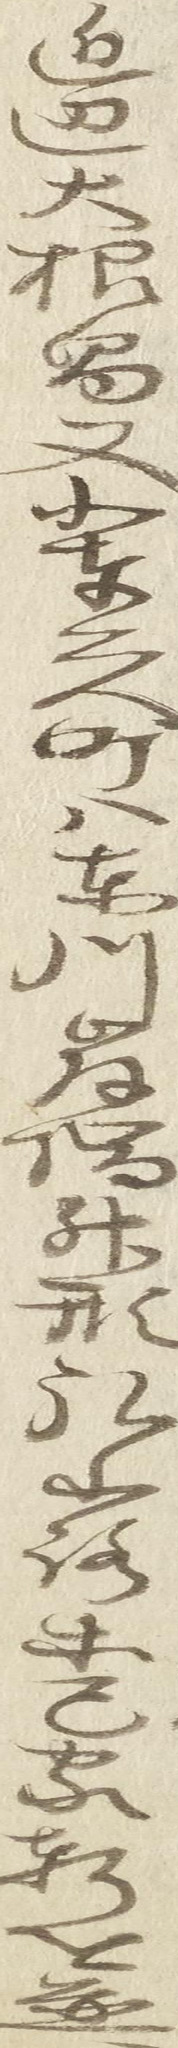近辺大根畠又北奉公人町は東川岸端升形弘小路等己家軒を並へ
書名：地震記　上
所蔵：東京大学地震研究所図書室 Earthquake Research Institute Library, The University of Tokyo, JAPAN
